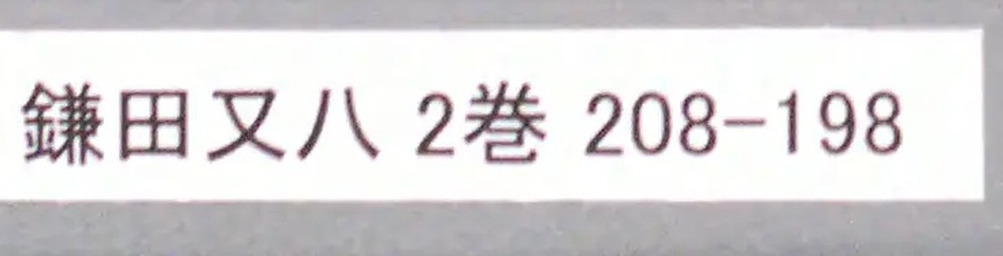鎌田又八全
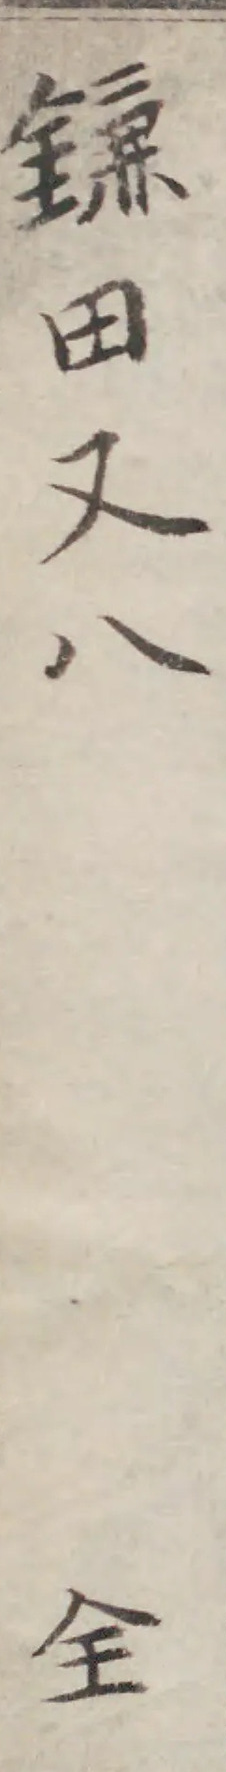鎌田又八全

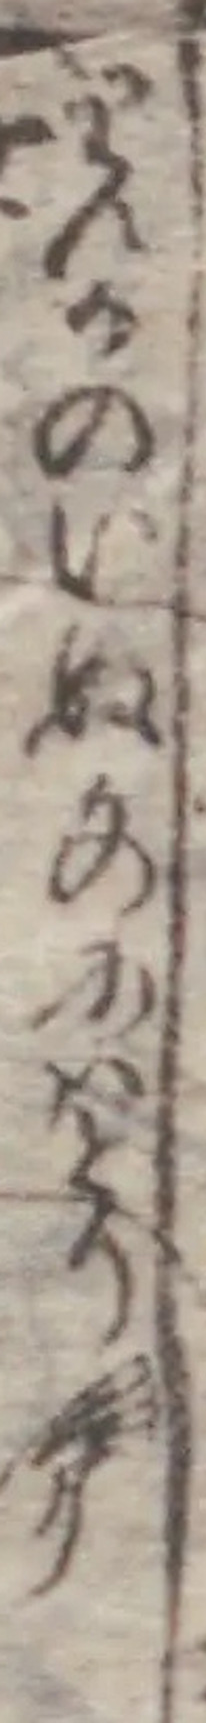りんかのいぬかのにはとり
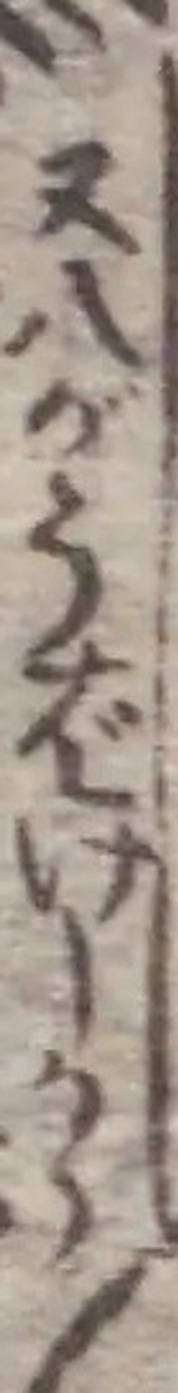又八がうばけしから
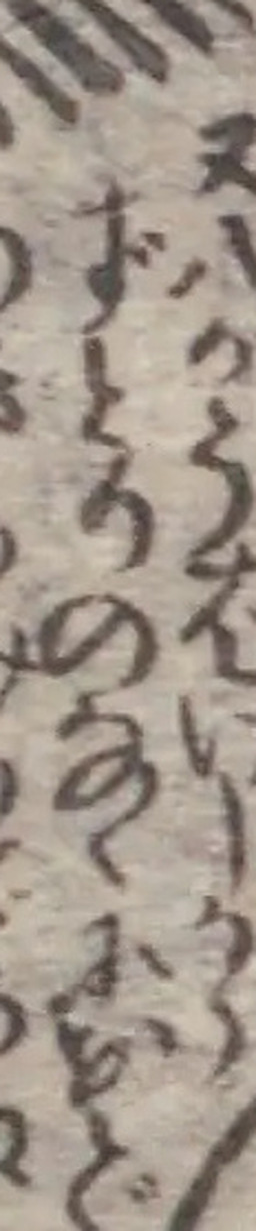ずとりのなくにおど
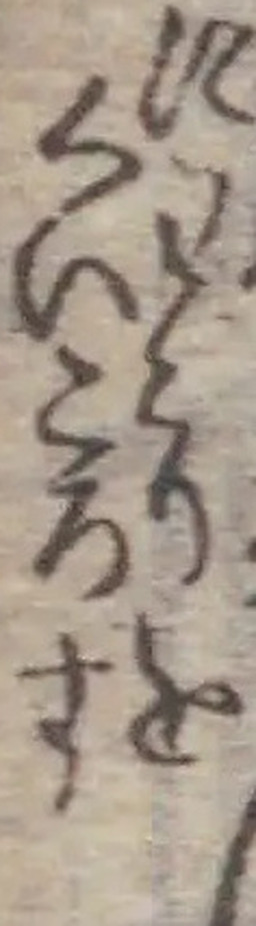くいころす

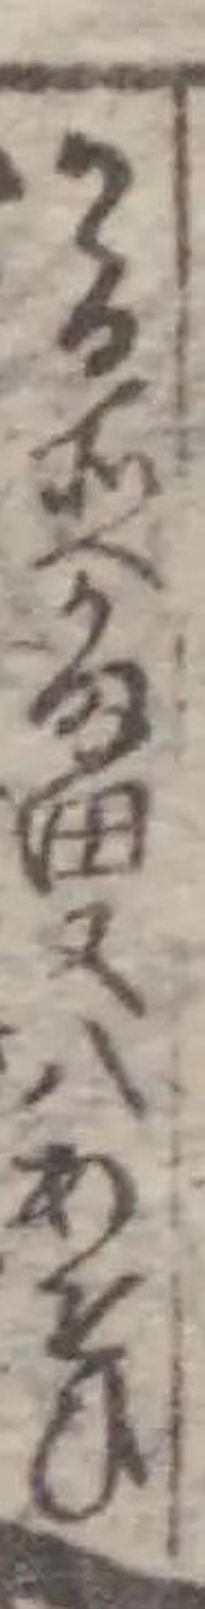かゝる所へかま田又八あそひ
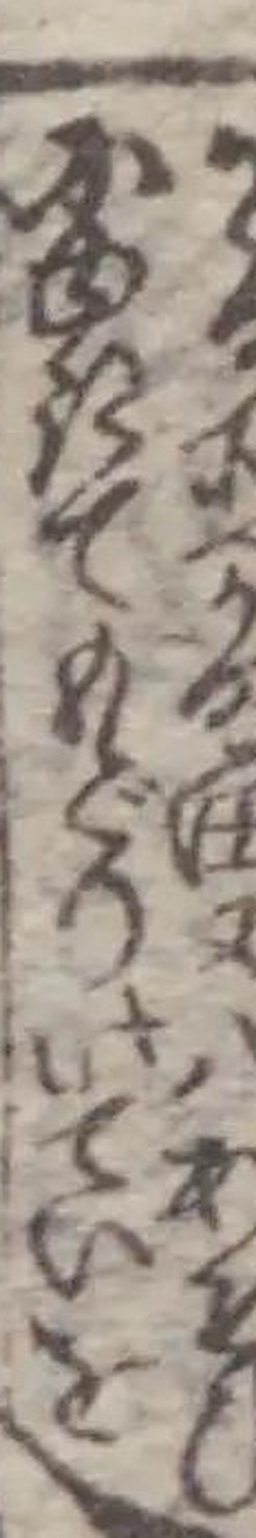にゆきてもどり此ていを
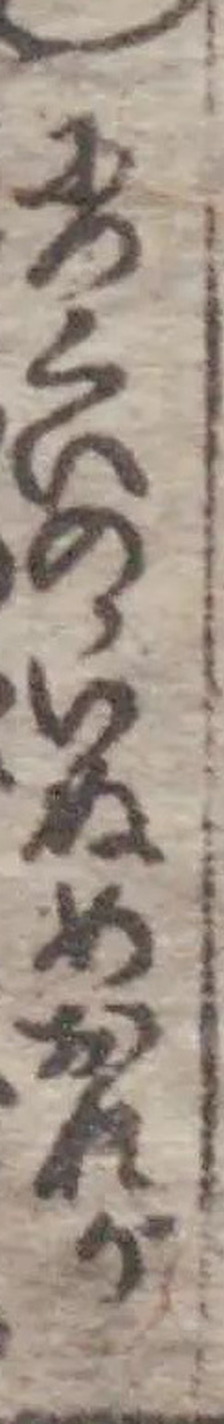につくいのらいぬめおれが
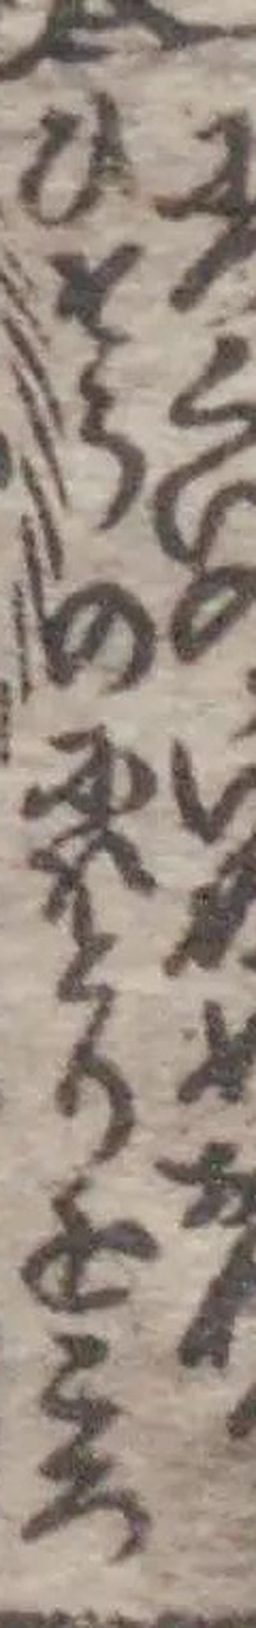ひそうのにはとりをころ
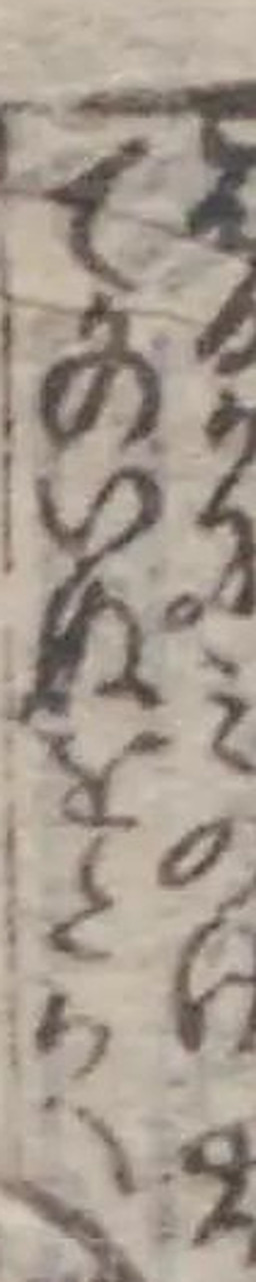てかのいぬをとらへ
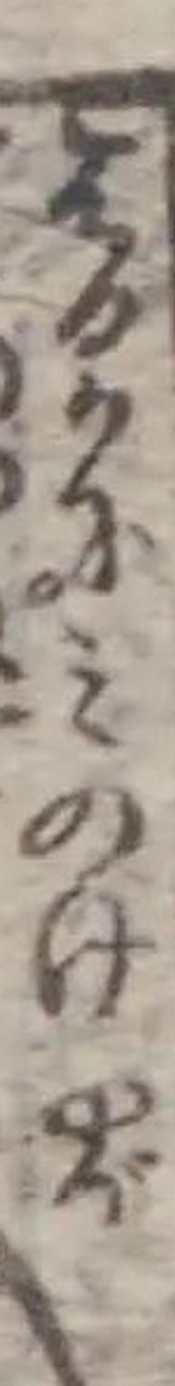はるかにみのけやが
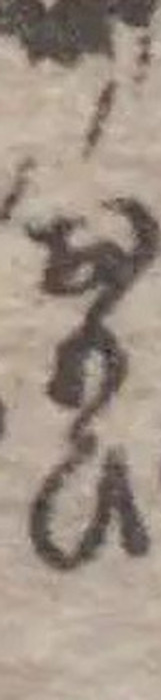おもひ
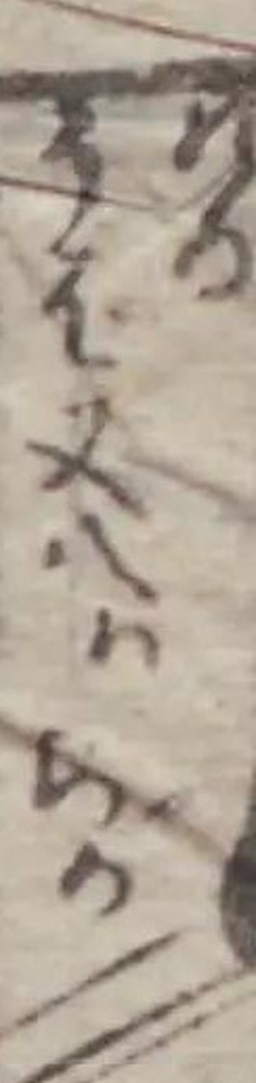うば又八かちか
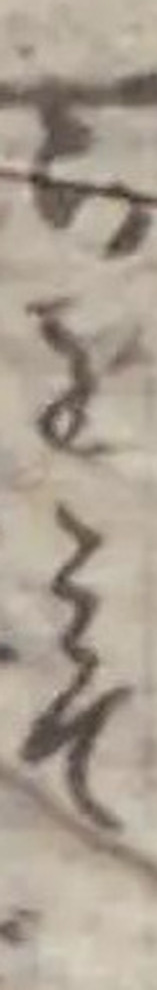らをみて
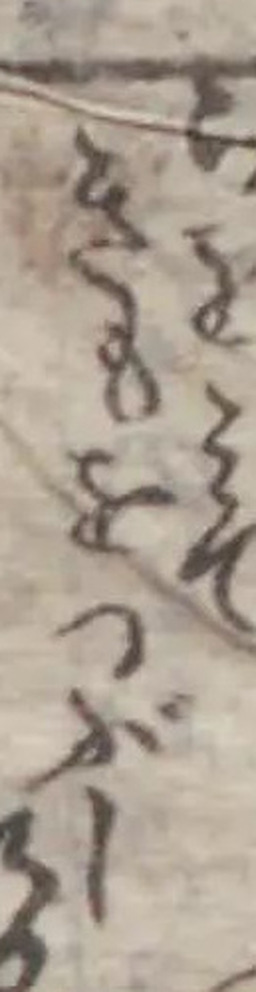きもをつぶし
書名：鎌田又八 2巻
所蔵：国立国会図書館 National Diet Library, JAPAN
